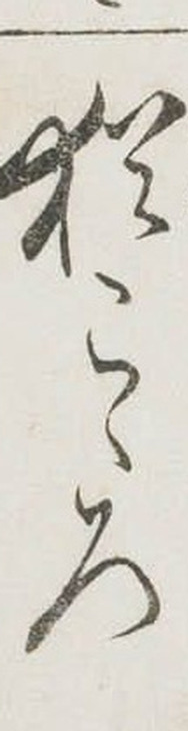猶こゝろ
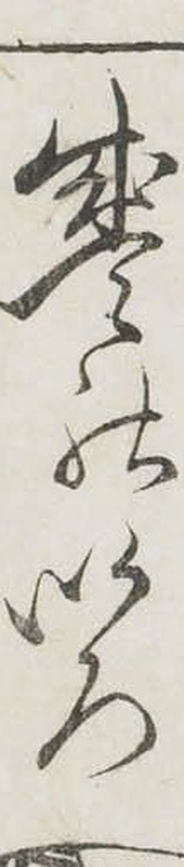盛のいろ
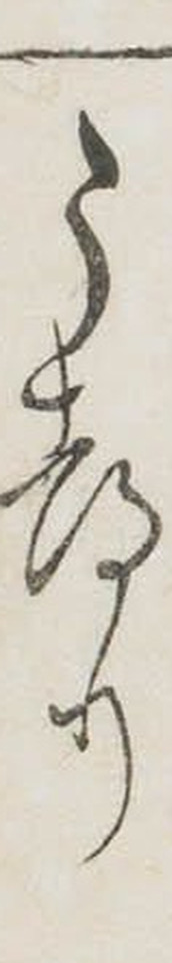うつり
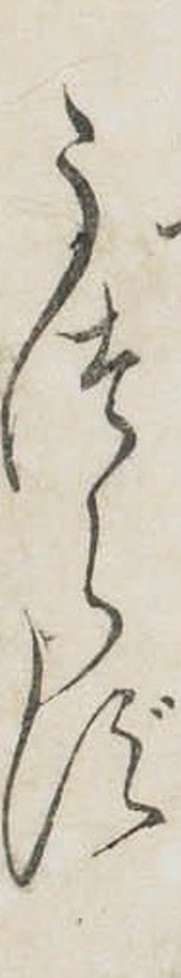うつらず

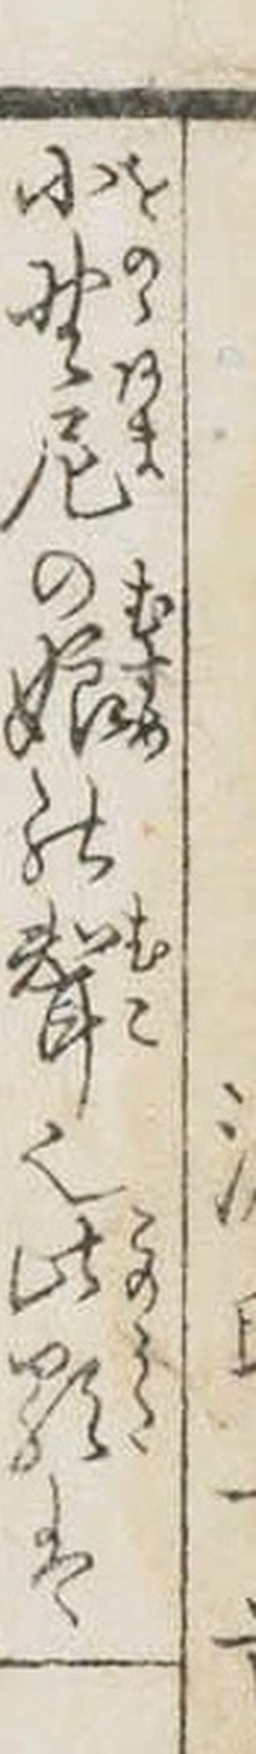小野尼の娘の聟也此歌は
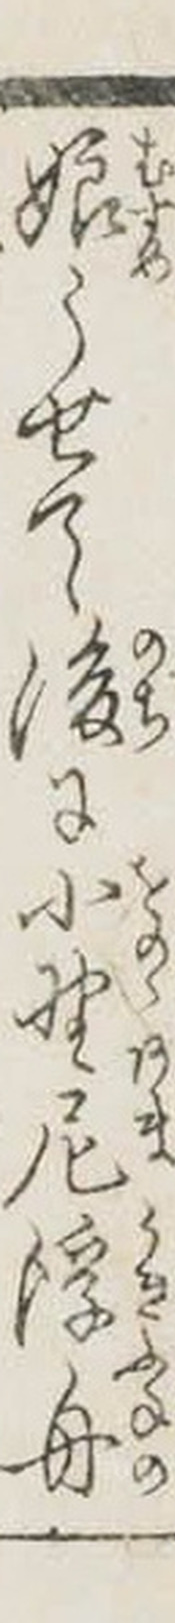娘うせて後に小野尼浮舟
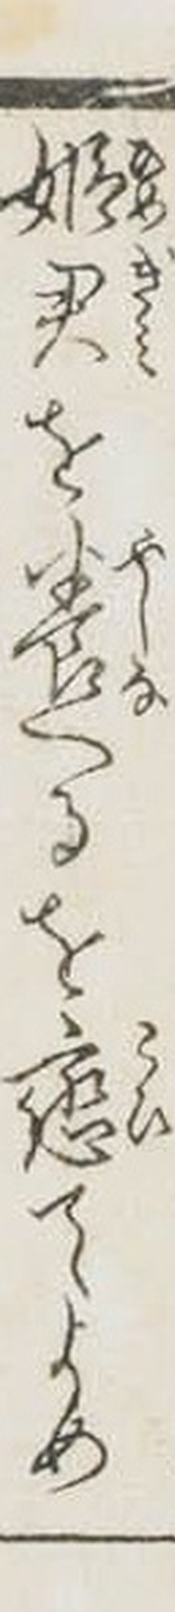姫君を養へるを恋てよめ
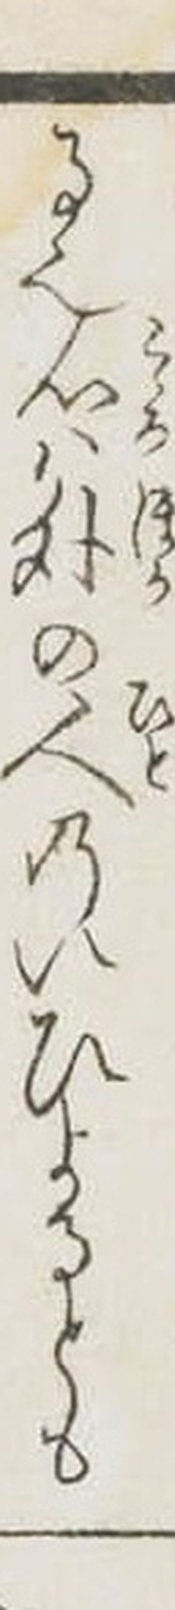る也心は外の人のいひよるとも
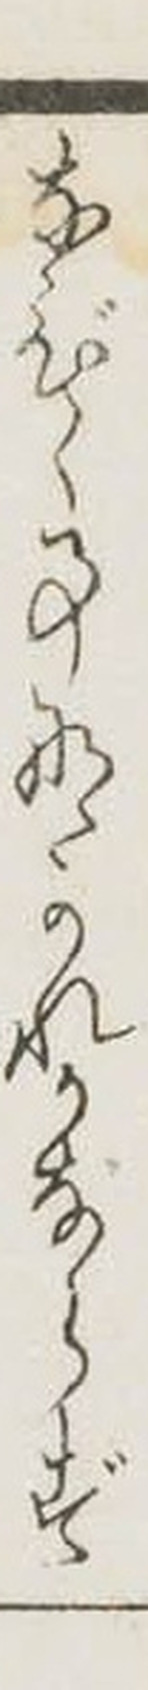なびく事なかれかならず
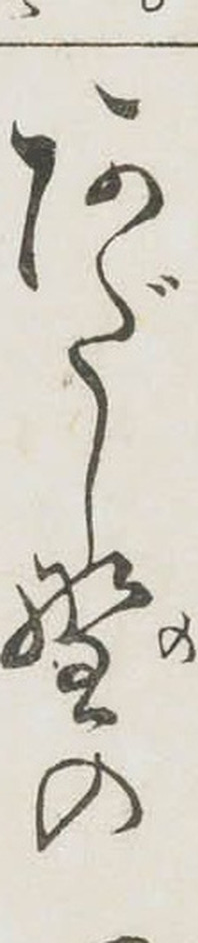あだし野の
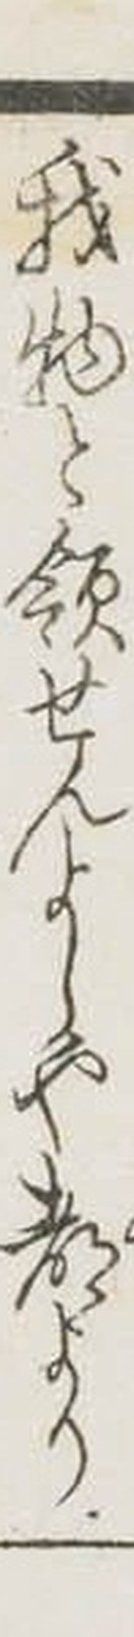我物と領せんよしや都より
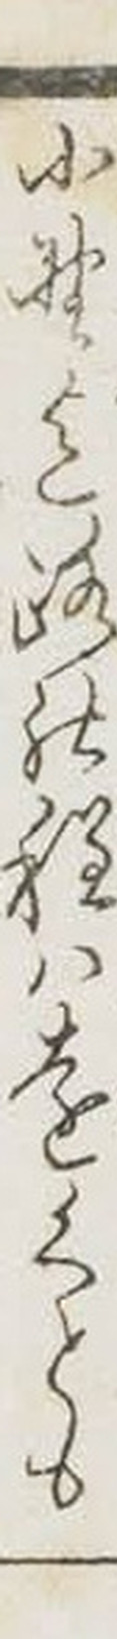小野迄路の程は遠くとも
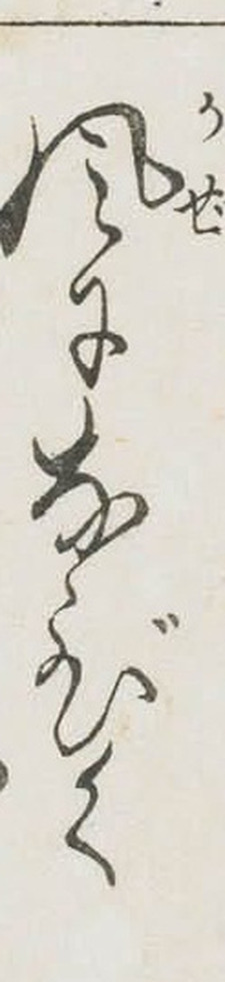風になびく
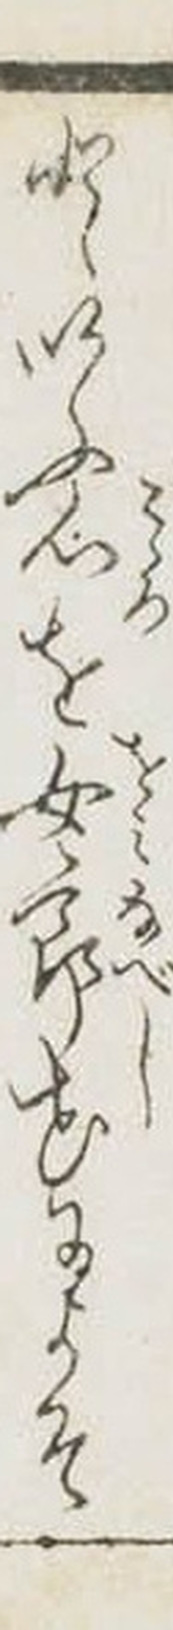といふ心を女郎花によそ
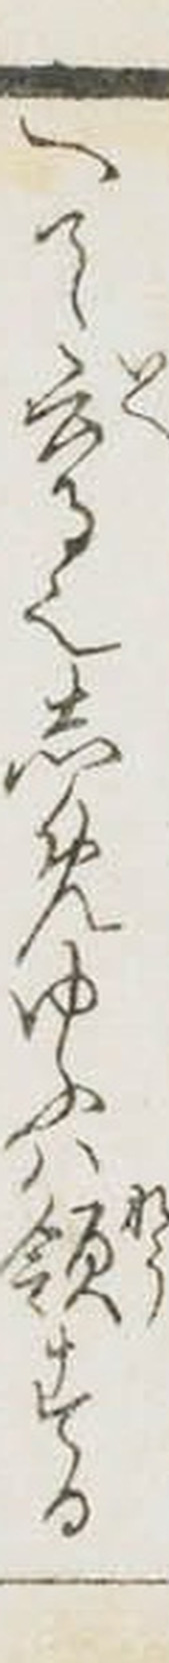へて云る也しめゆふは領する
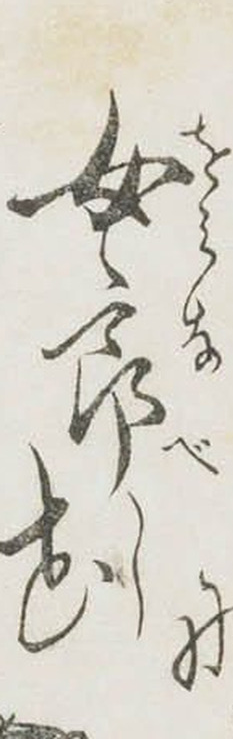女郎花
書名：源氏百人一首
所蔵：東京学芸大学教育コンテンツアーカイブ
